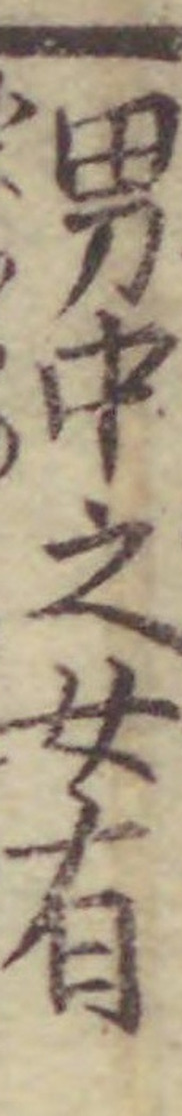男中之女有
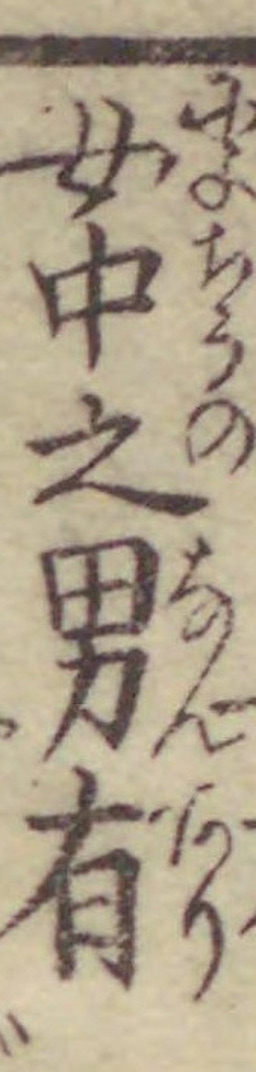女中之男有
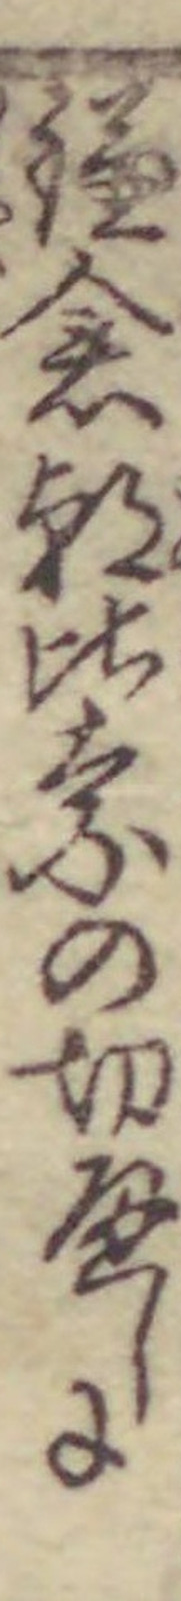鎌倉朝比奈の切通しに
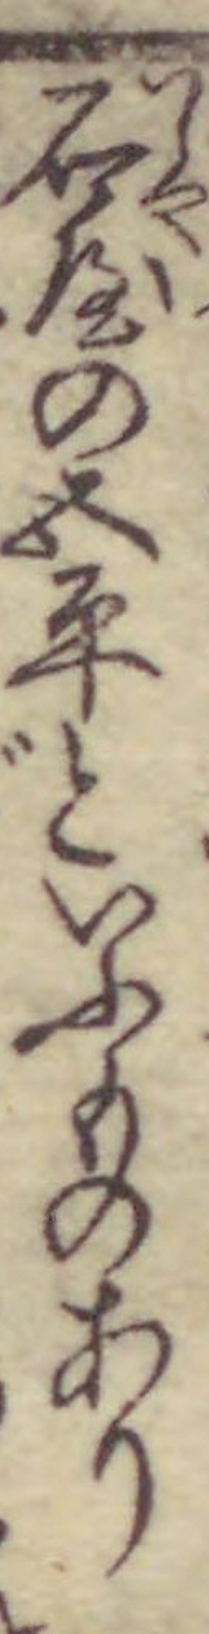石屋の五平といふものあり
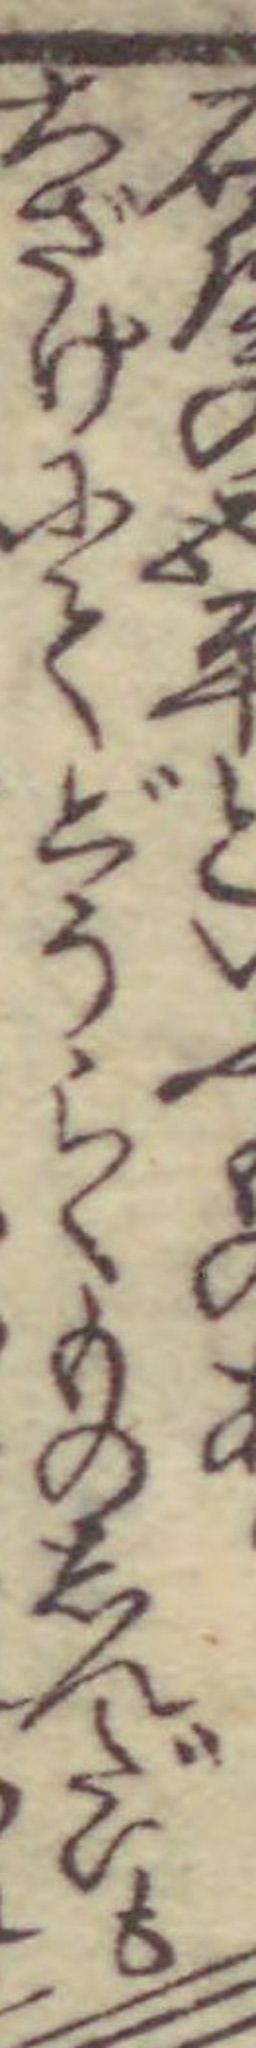大ざけにてどうらくものしいだいも
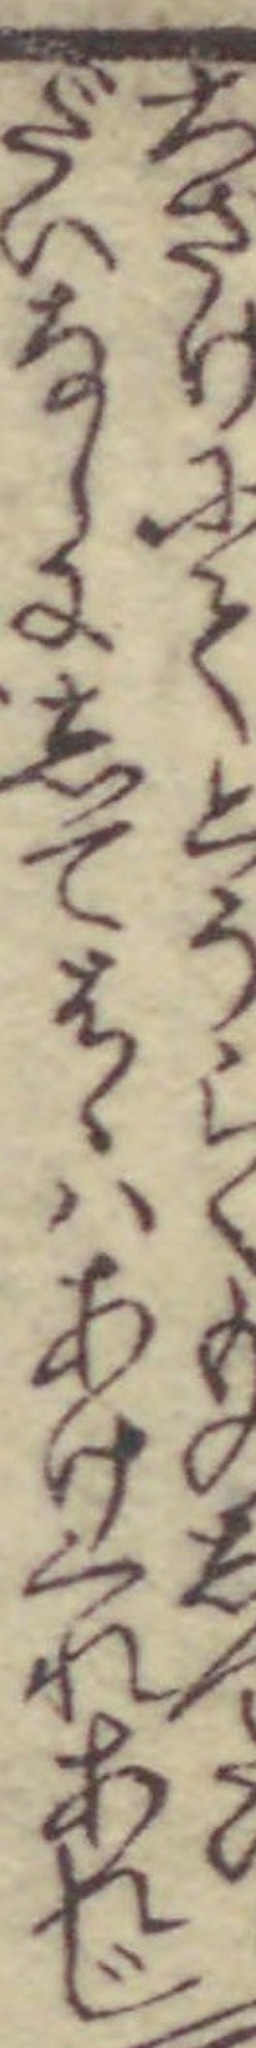だいなしにしてはゝはあけくれあんじ
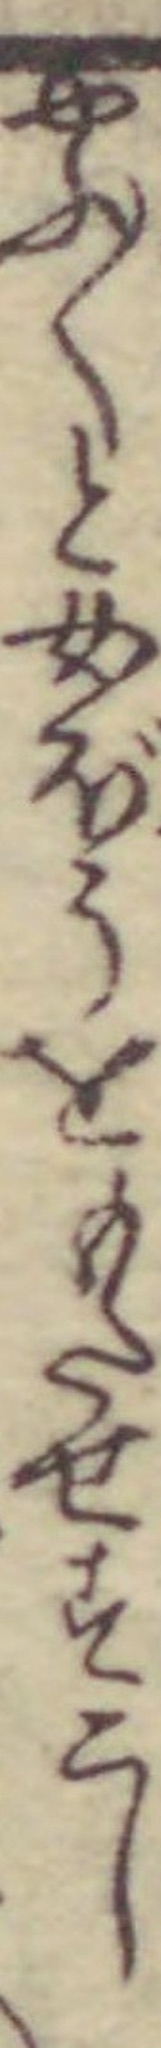やふ〳〵と女ぼうをもたせすこし
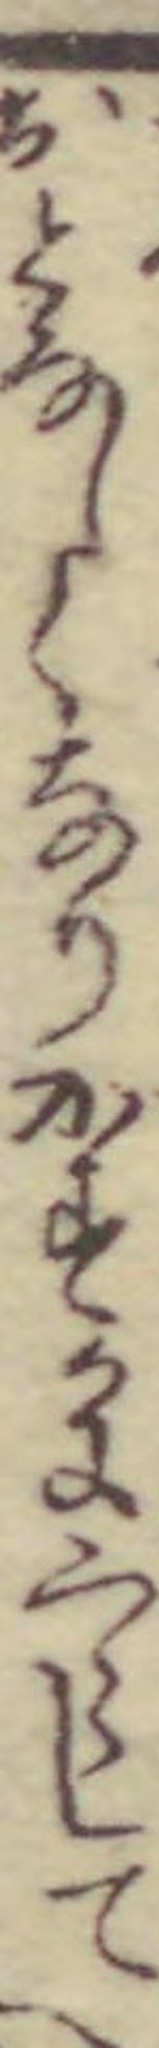おとなしくなりかすかにくらして
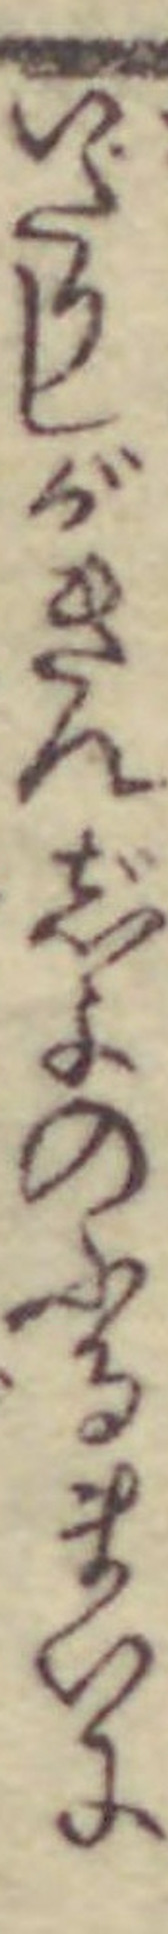いたりしがきんじよのふるまいに
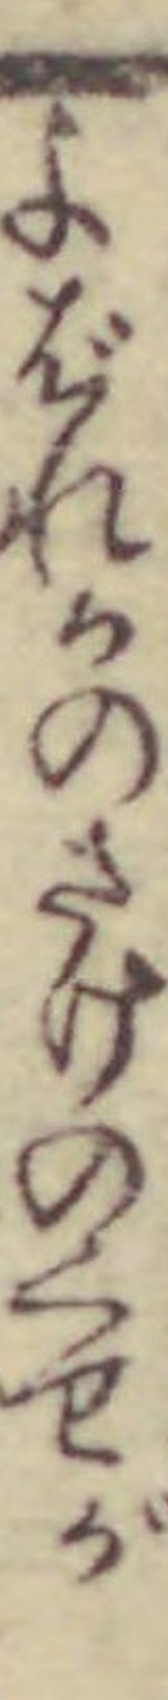よばれかのさけのくせが
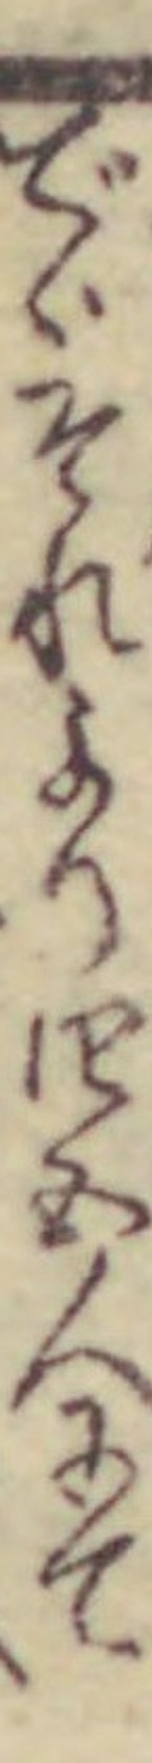でゝそれより四五人にて
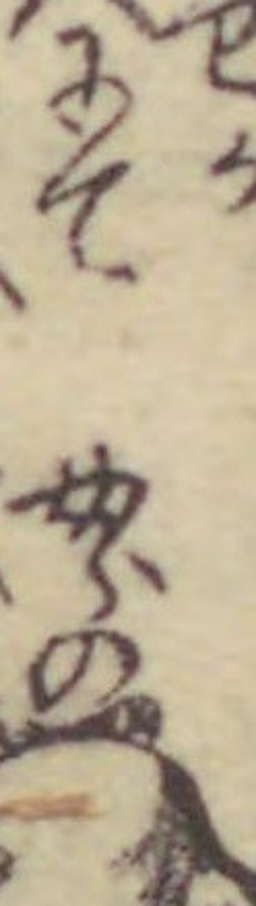女郎の
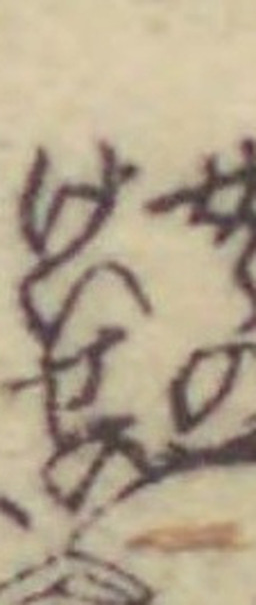けいせい
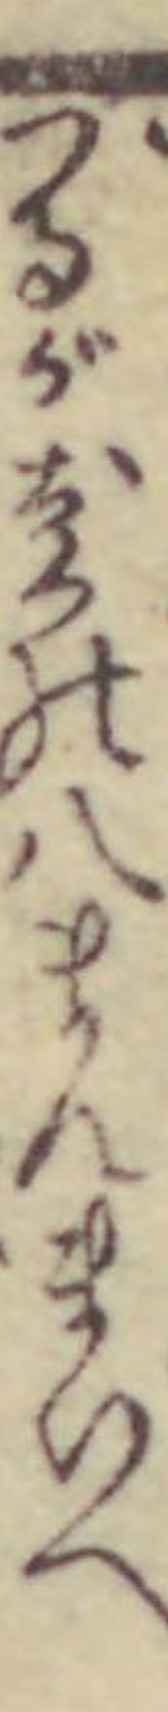つるがおかの八まんまいへ
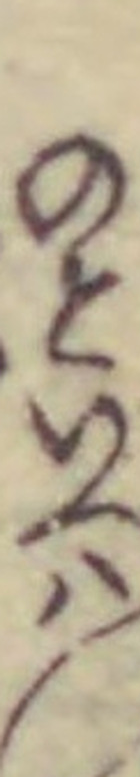のといへは
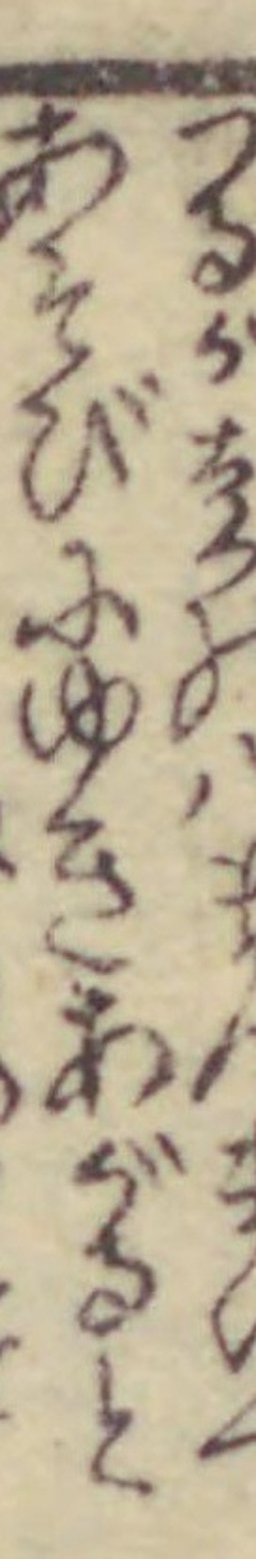あそびにゆきあがると
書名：大通人穴[サガシ] 3巻
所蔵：国立国会図書館 National Diet Library, JAPAN
